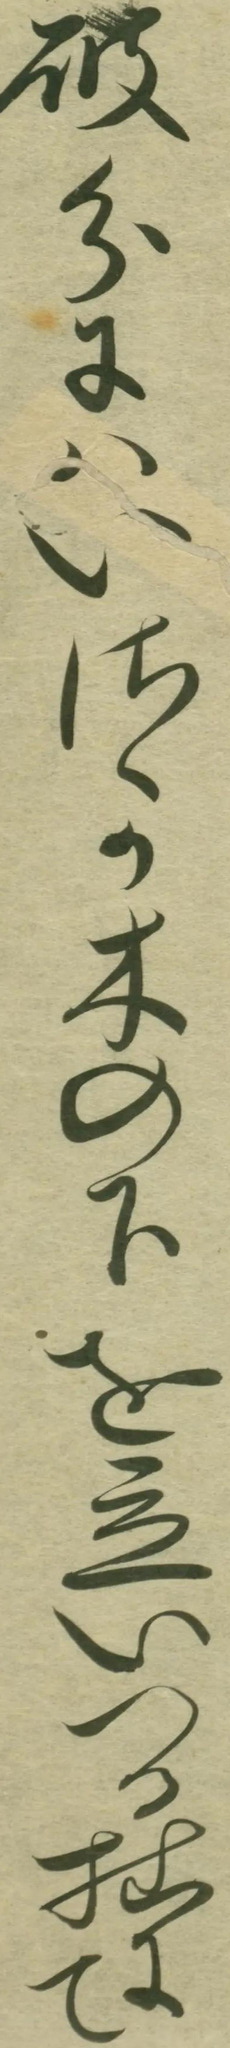破分にはいさゝか木の下を立いつる様にて
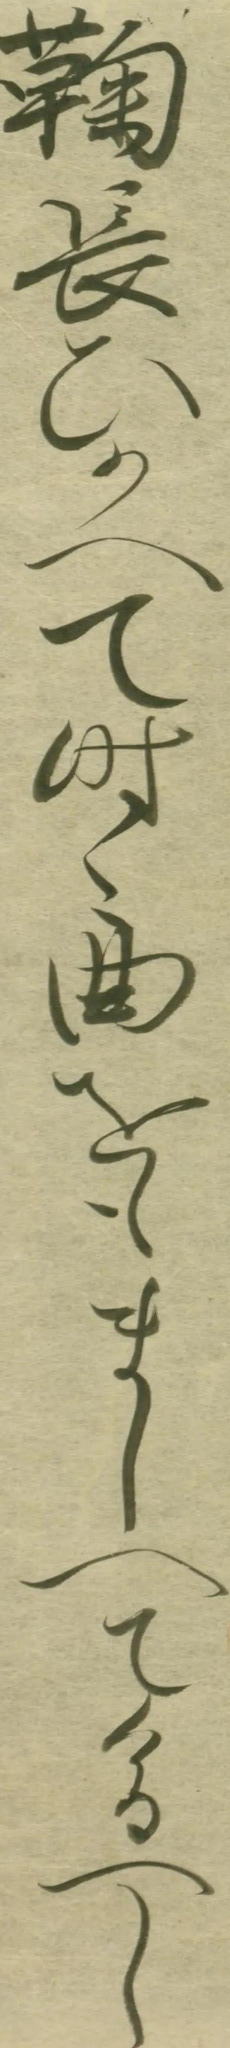鞠長ひかへて時々曲をもましへてけるへし
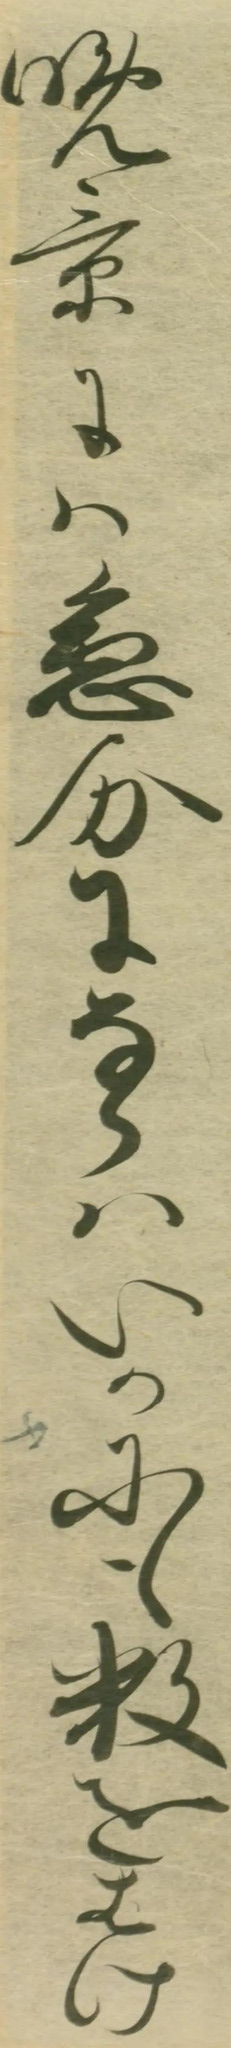晩景には急分にならはいかにも数をはけ
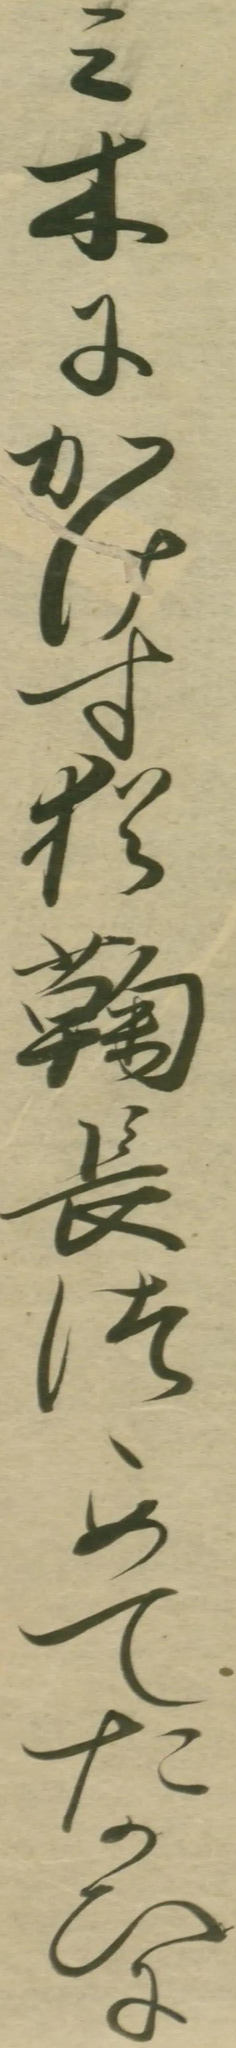み木にかけす猶鞠長つゝめてたかひに

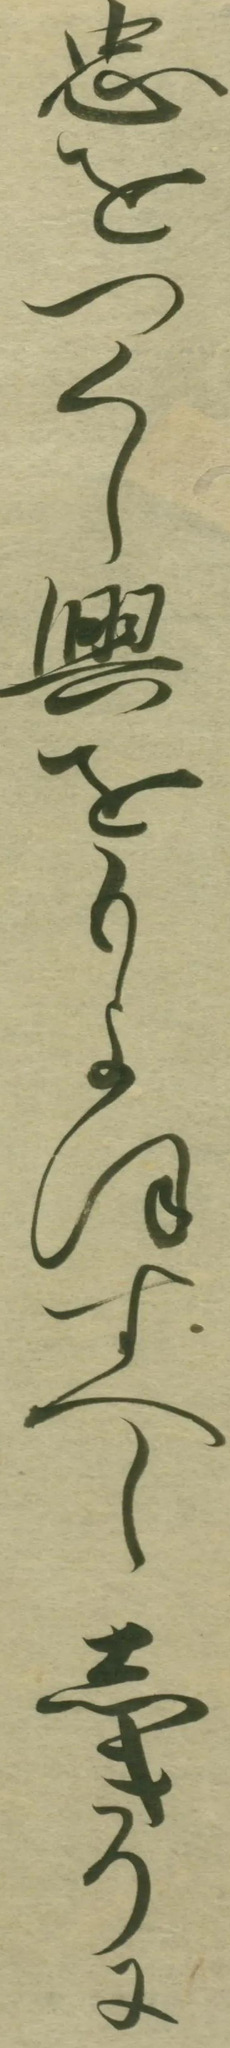忠をつくし興をもよほすへししきりに
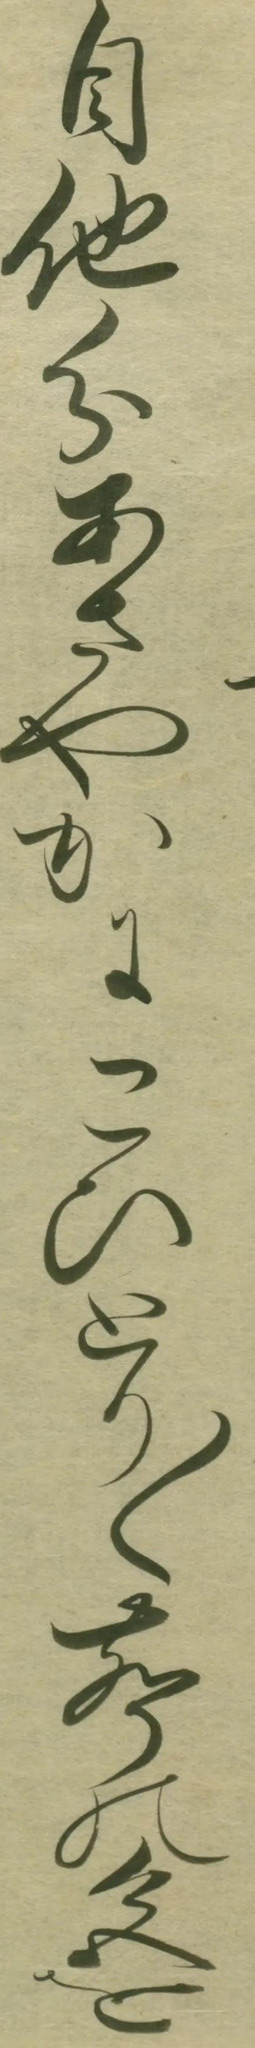自他分あさやかにこひとり〳〵声の色を
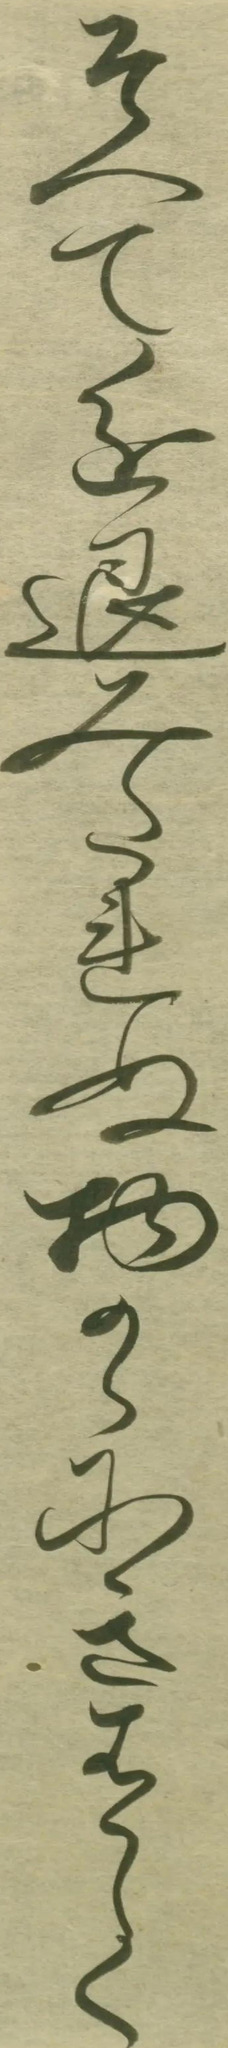そへて進退みたれぬ物からにきはしく
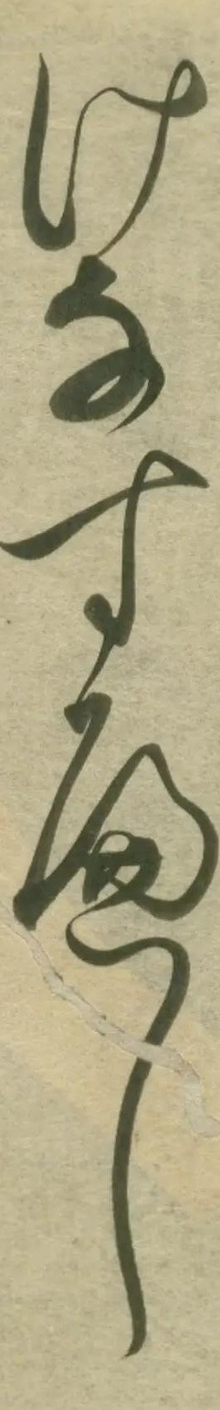けなすへし
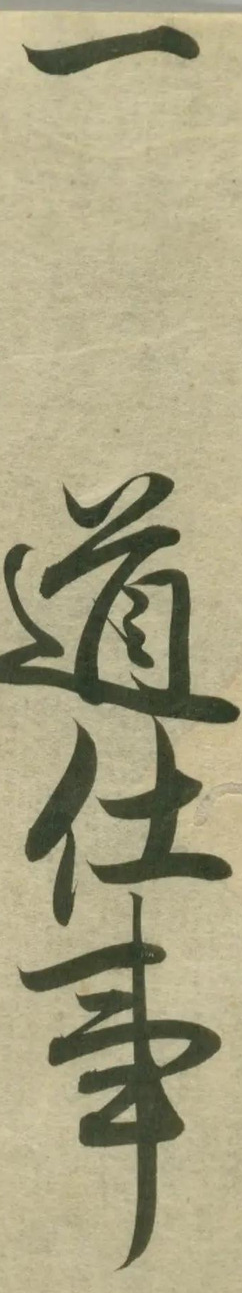一道仕事
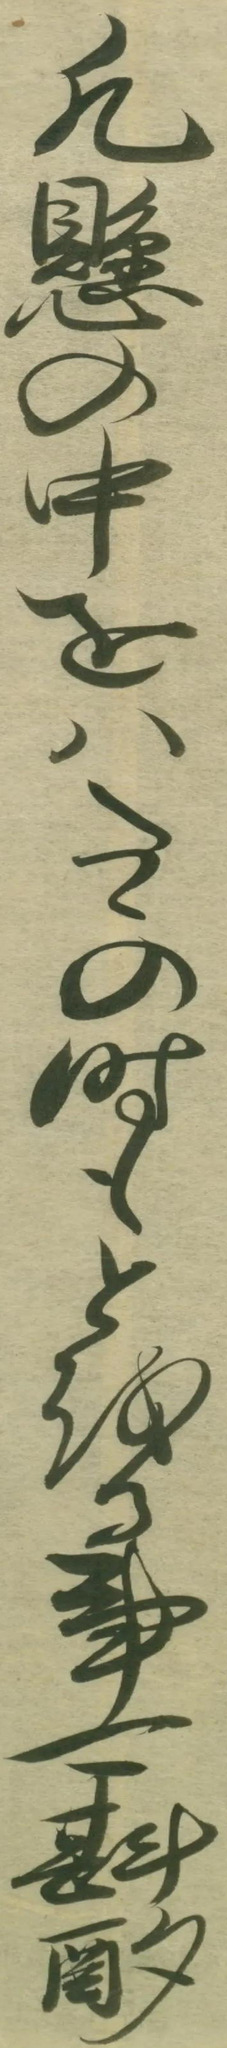凡懸の中をはたゝの時もとをる事可斟酌
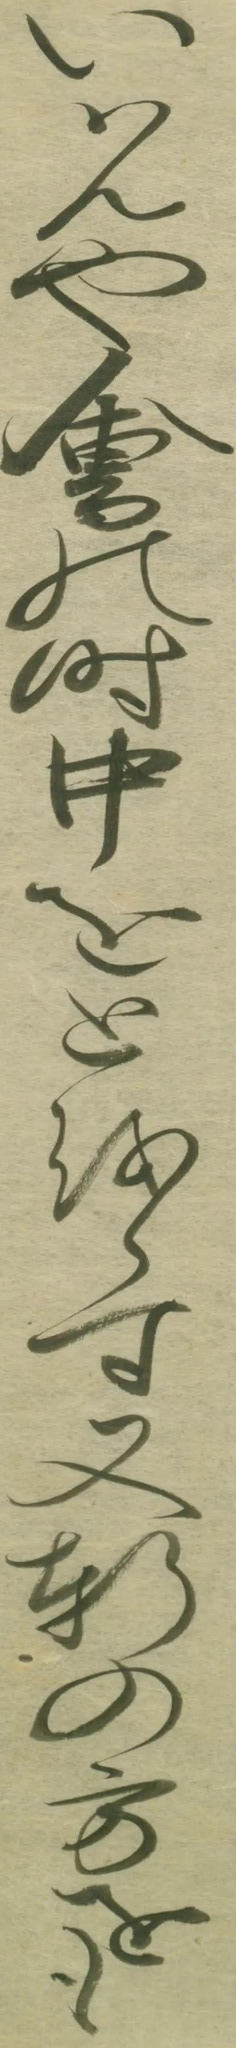いはんや会の時中をとをらす又軒の方をも
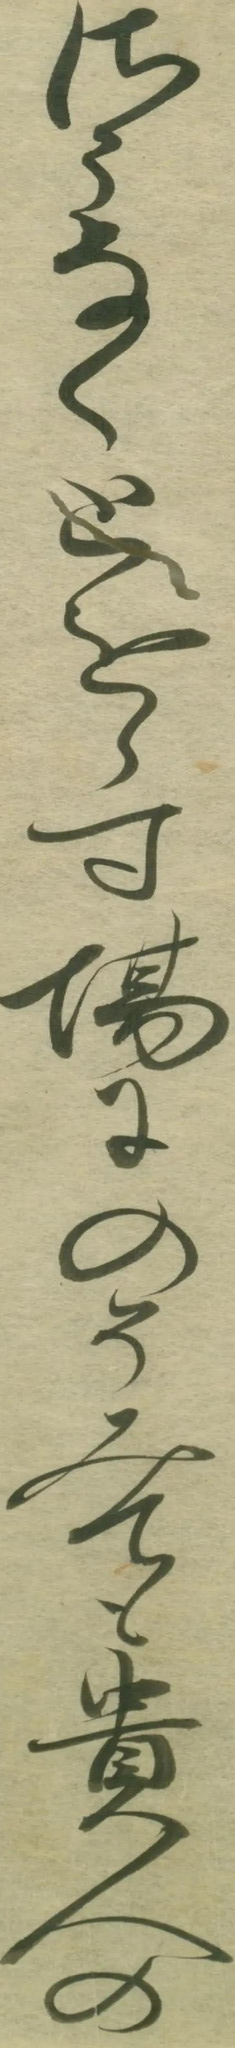さうなくとをらす場にのそみても貴人の
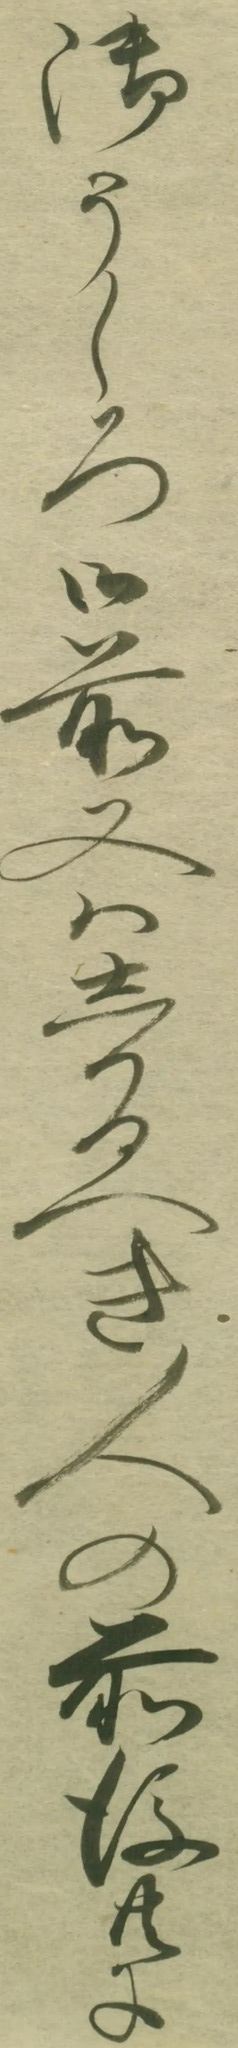御うしろ御前又はしかるへき人の前後共に
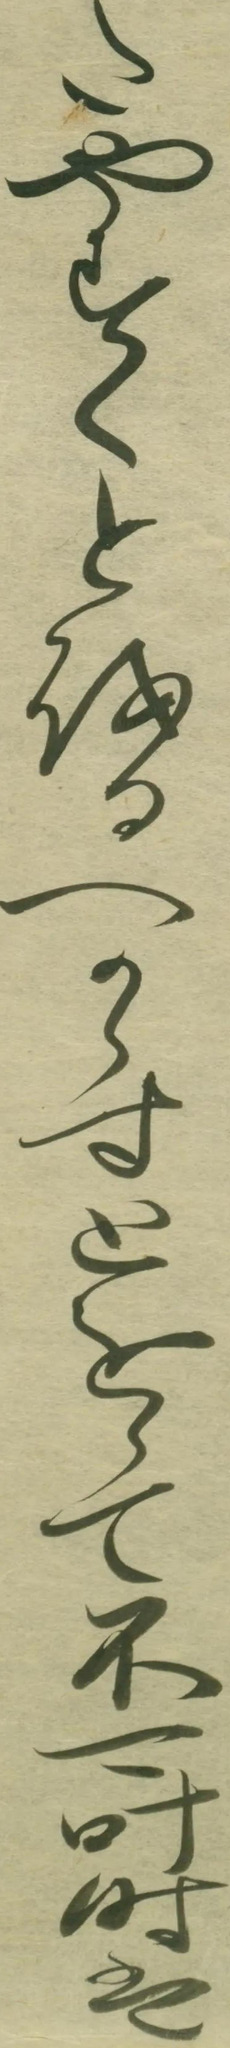たやすくとをるへからすとをらて不可叶時は
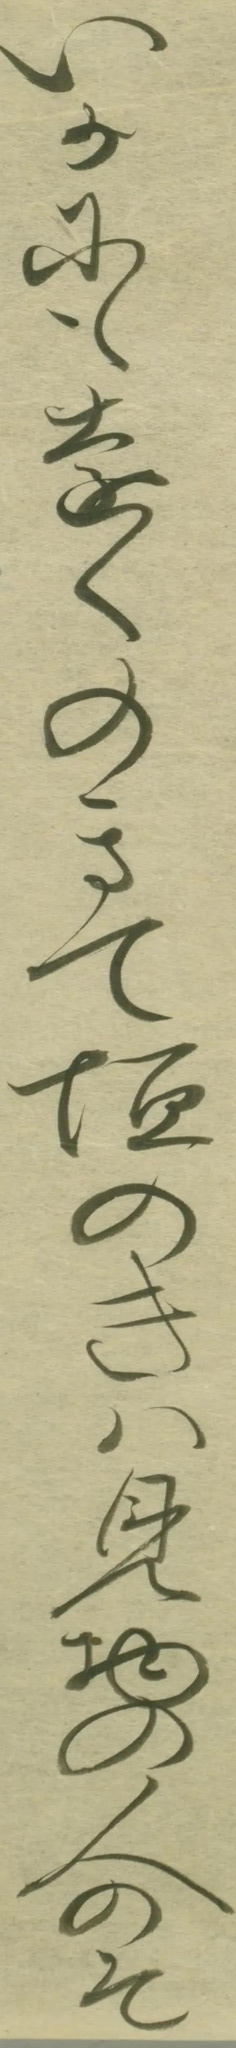いかにも遠くのきて垣のきわ見物の人のそ
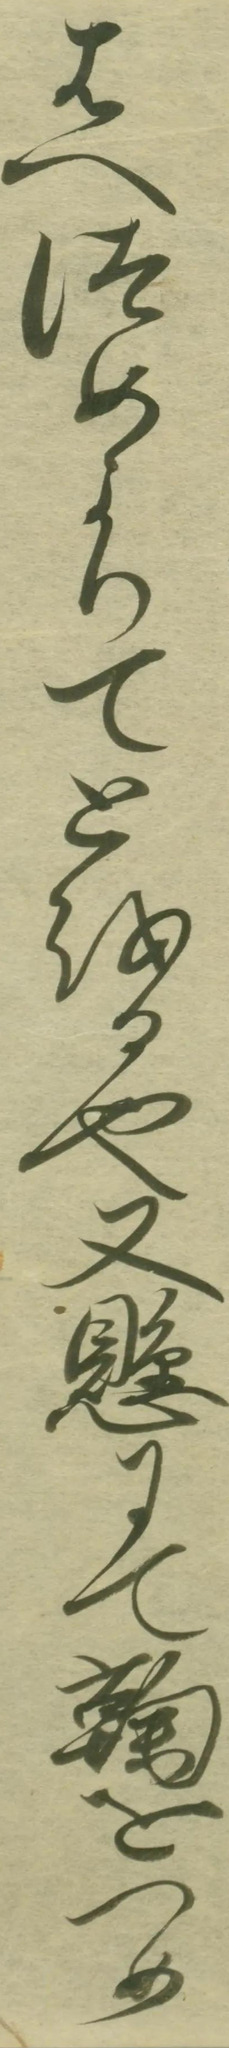はへつめよりてとをる也又懸にて鞠をつめ
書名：蹴鞠之条々大概
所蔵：国立国会図書館 National Diet Library, JAPAN
